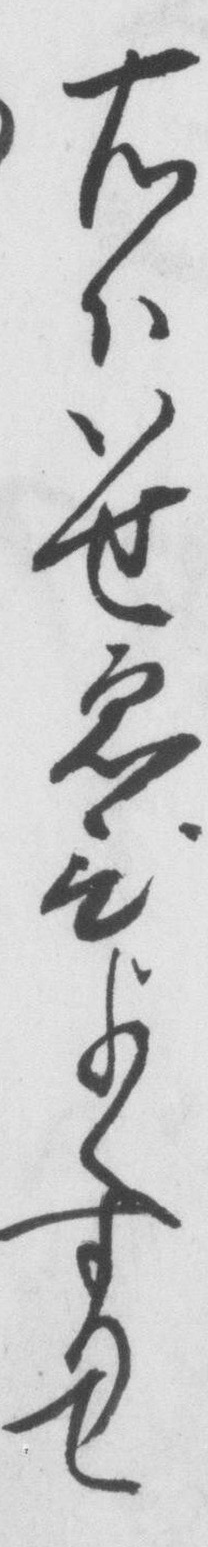大いせゑひよくすりて

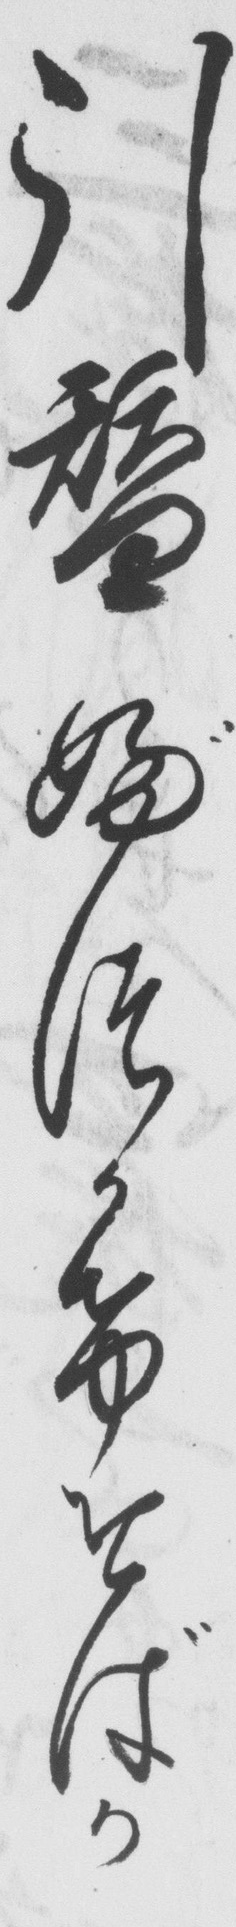引ぶつかけそばか
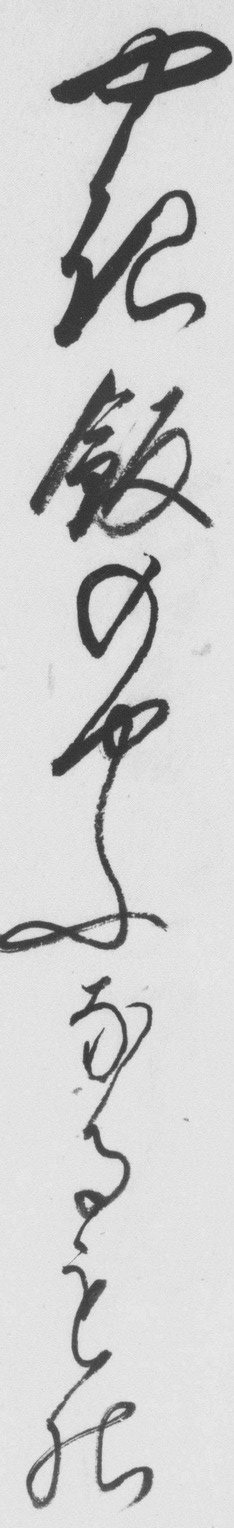やき飯のやふなるもの
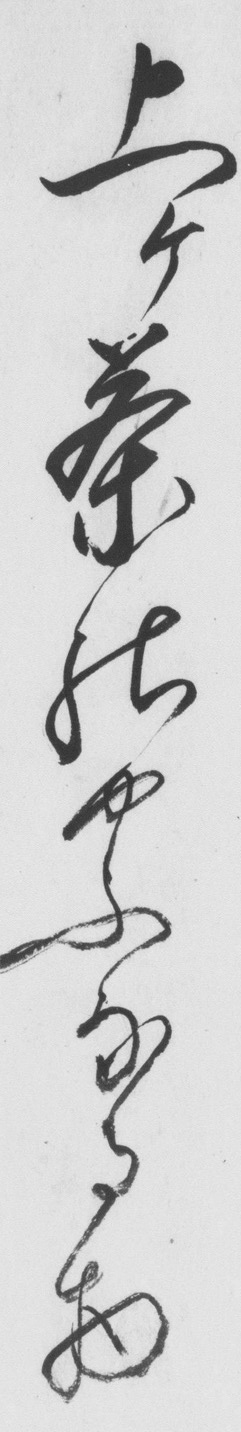上ヶ茶のやうなる物

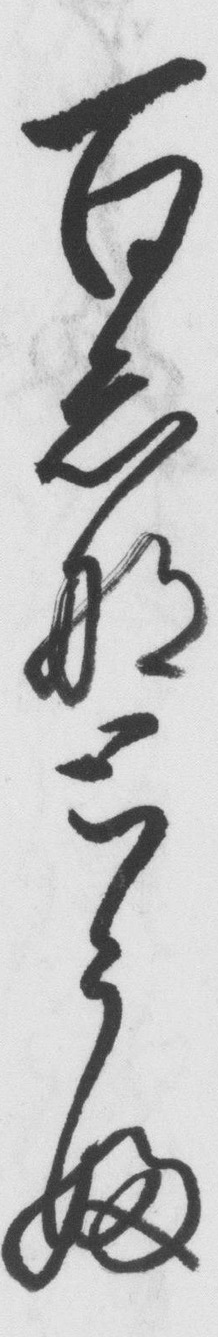百しなとうふ
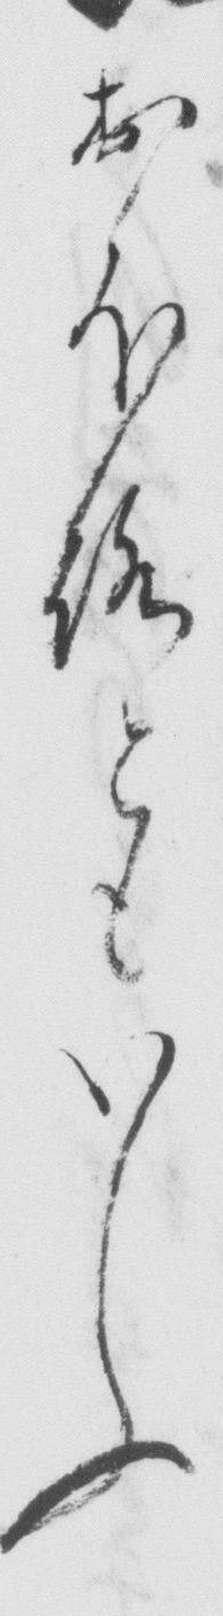おほろともいふ

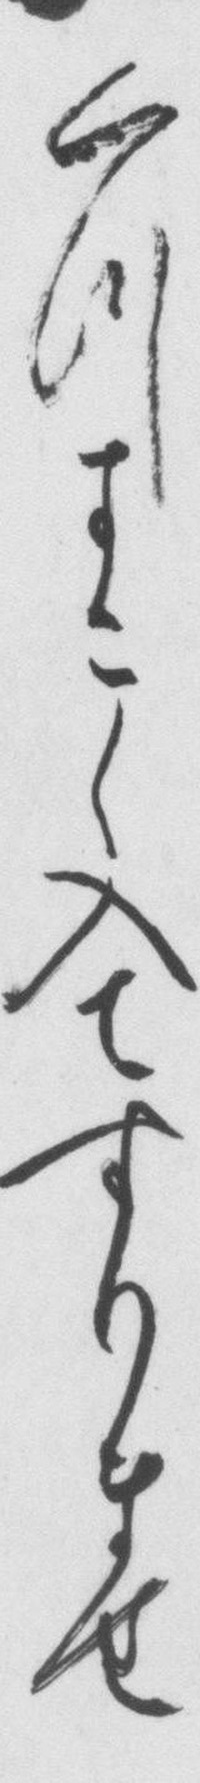くつすこし入てすりませ
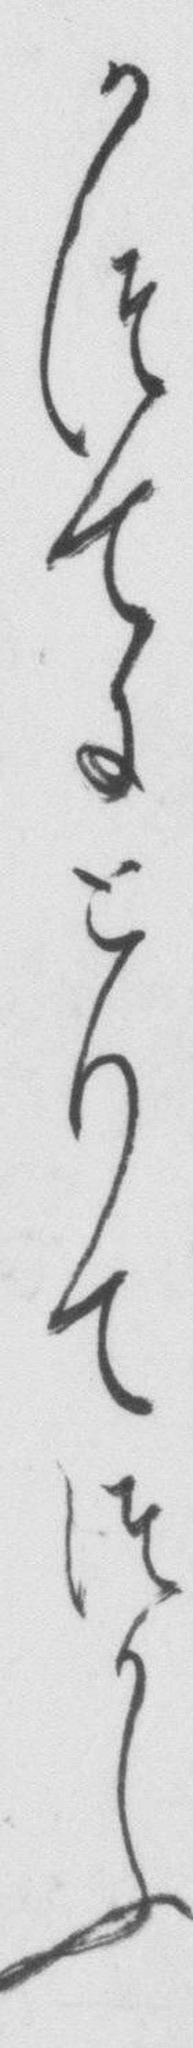かつてとりてつかふ
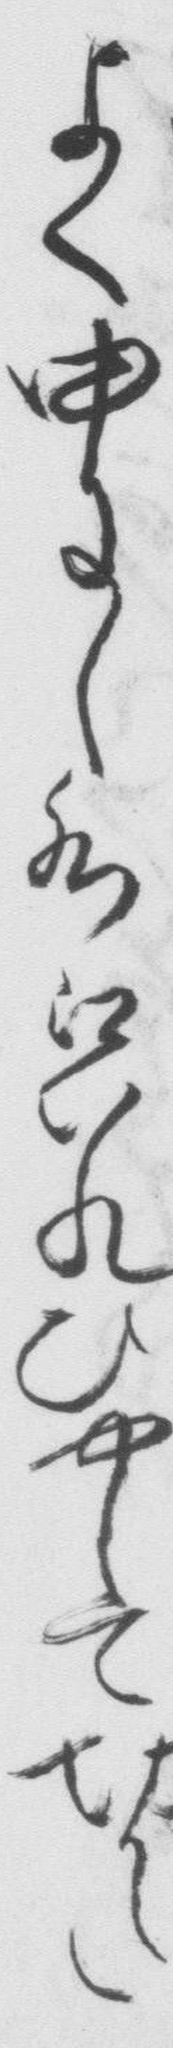よくゆにし水いひやして切かた
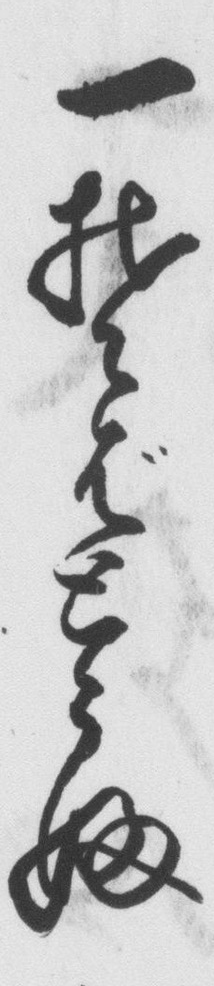一上ヶとうふ
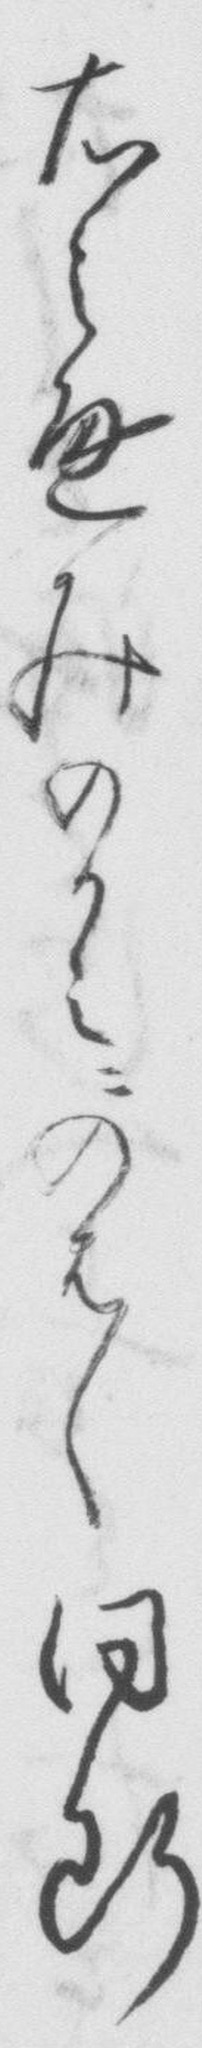右みのかミにのばし同段
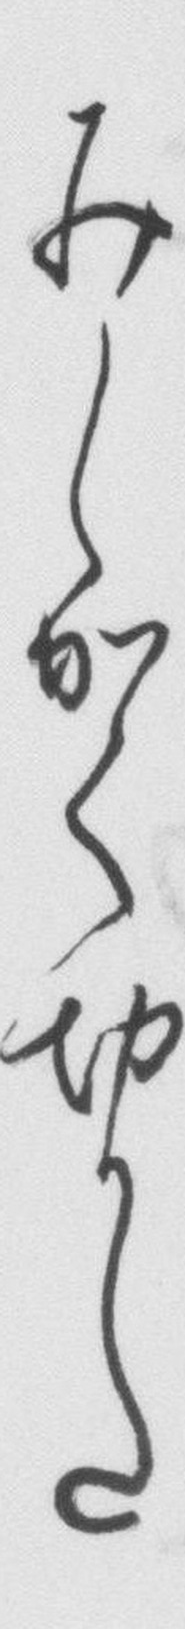みしかく切かた
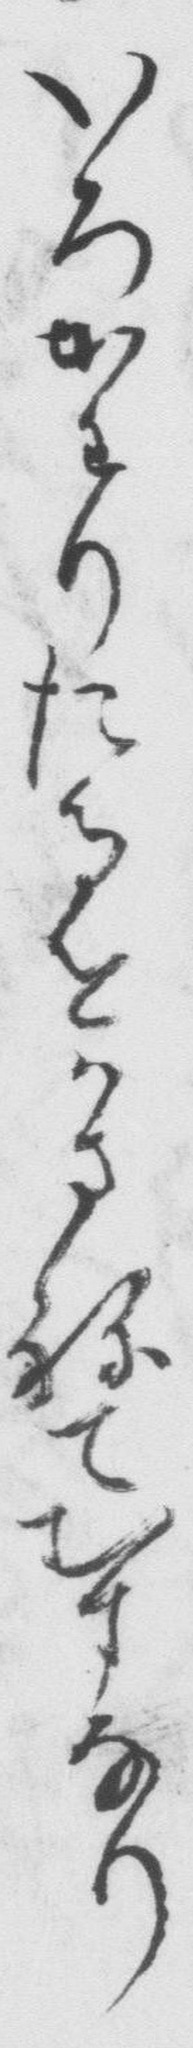いろかはりたちをかさねてむすなり
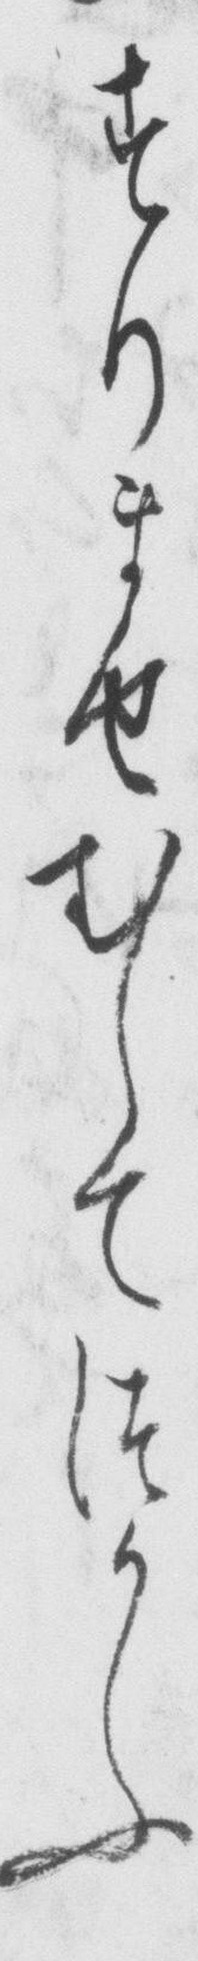すりませむしてつかふ
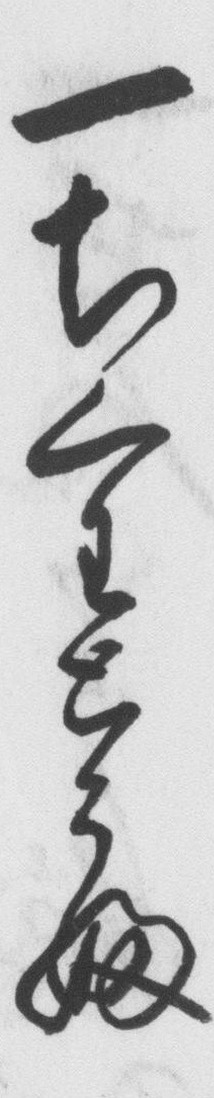一ちくわとうふ
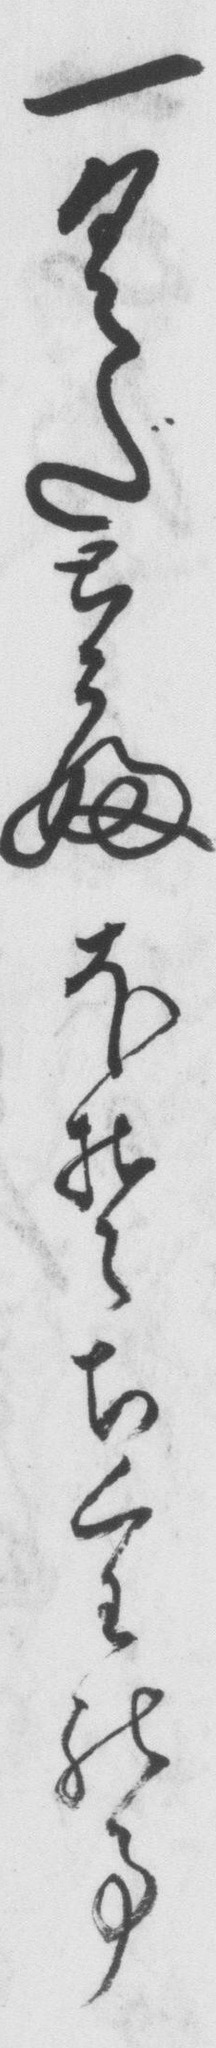一だとうふほそちくわの
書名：料理筌
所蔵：大阪府立大学学術情報センター 国文学研究資料館
